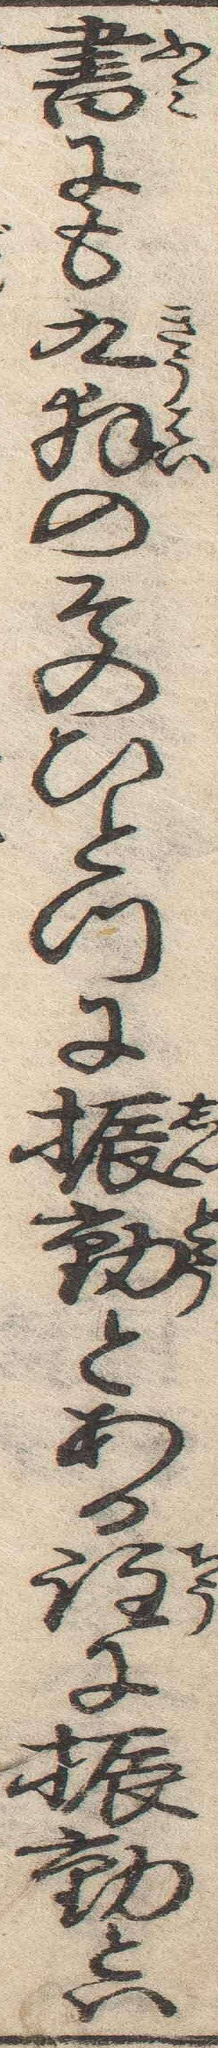書にも九拝のそのひとつに振動とある註に振動とは
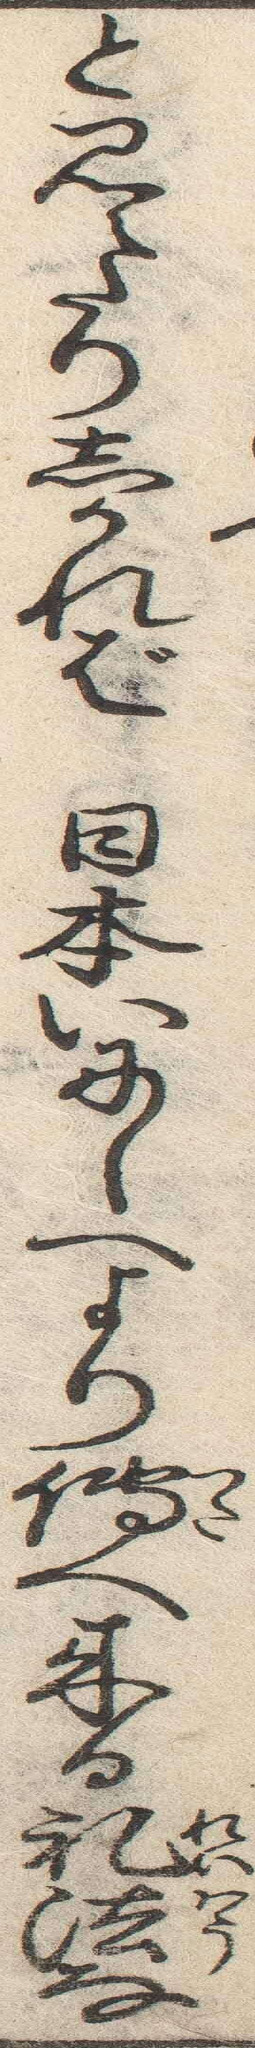と見えたりしかれば日本はいにしへより伝へ来る礼法な
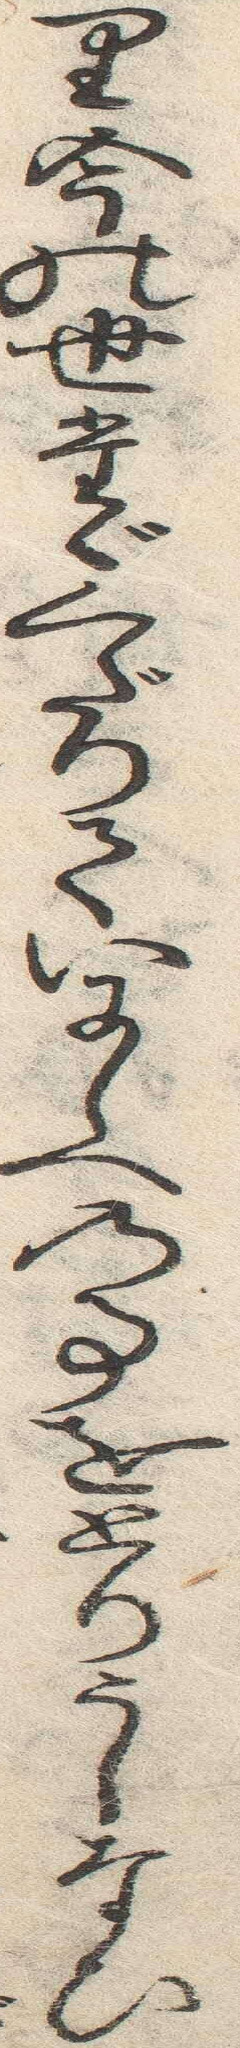り今の世たゞくだりていにしへの事をとりうしなひ
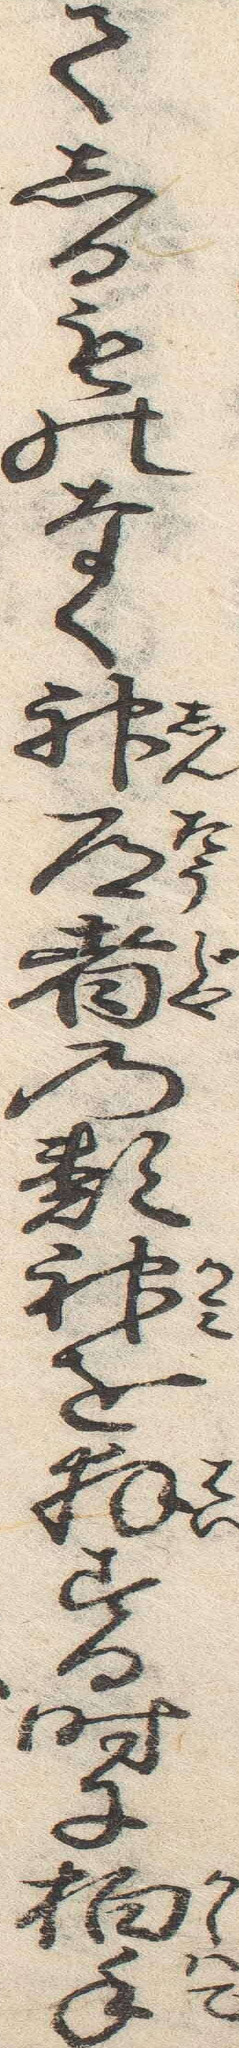てしるものなく神道者の類神を拝する時に拍手
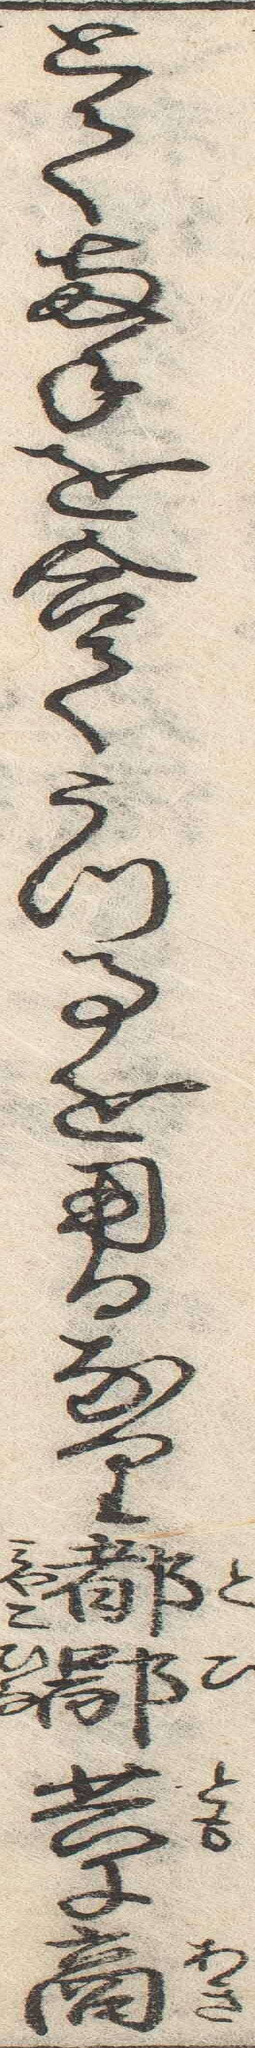とて両手を合てうつ事を用るなり都鄙共に商
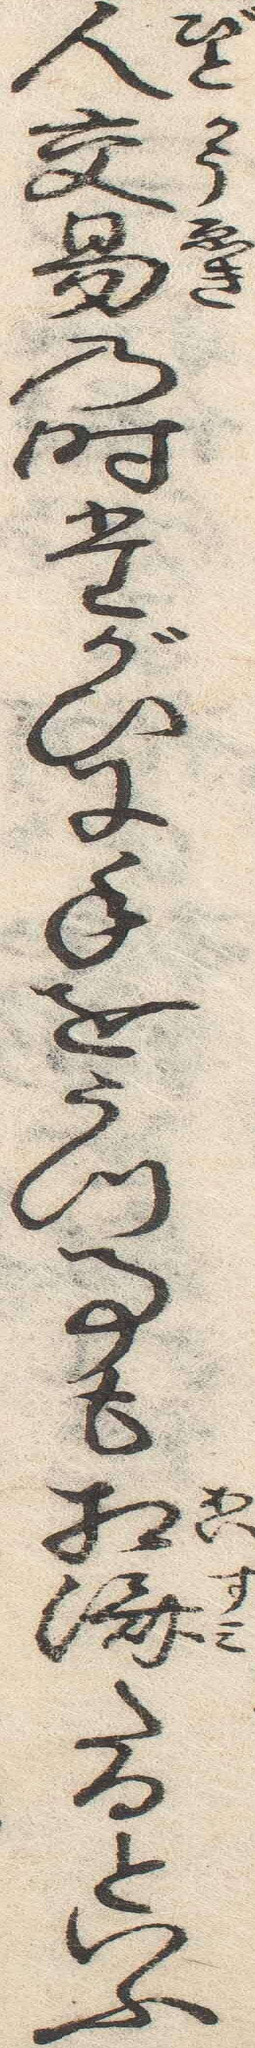人交易の時たがひに手をうつ事も相済たるといふ
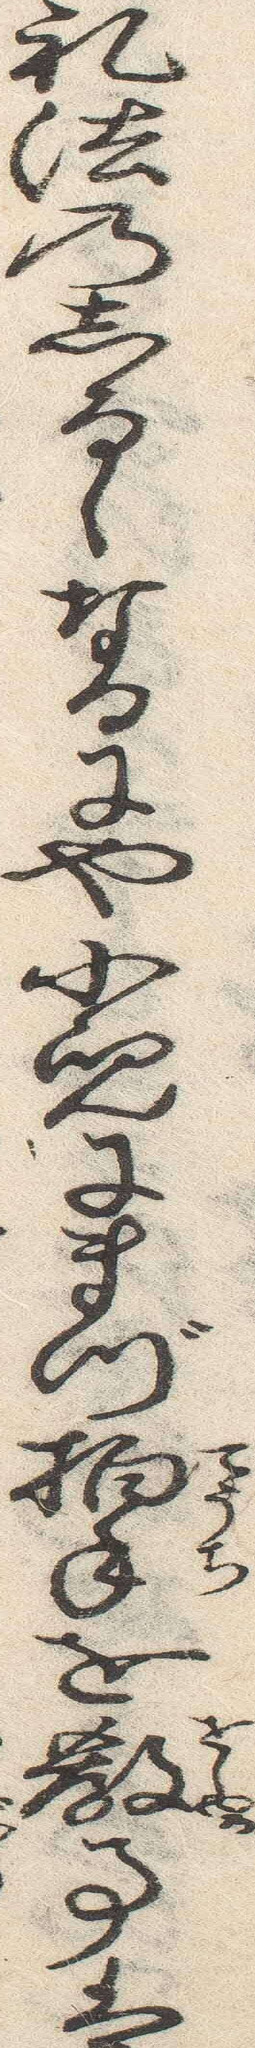礼法のしるしなるにや小児にまづ拍手を教事は
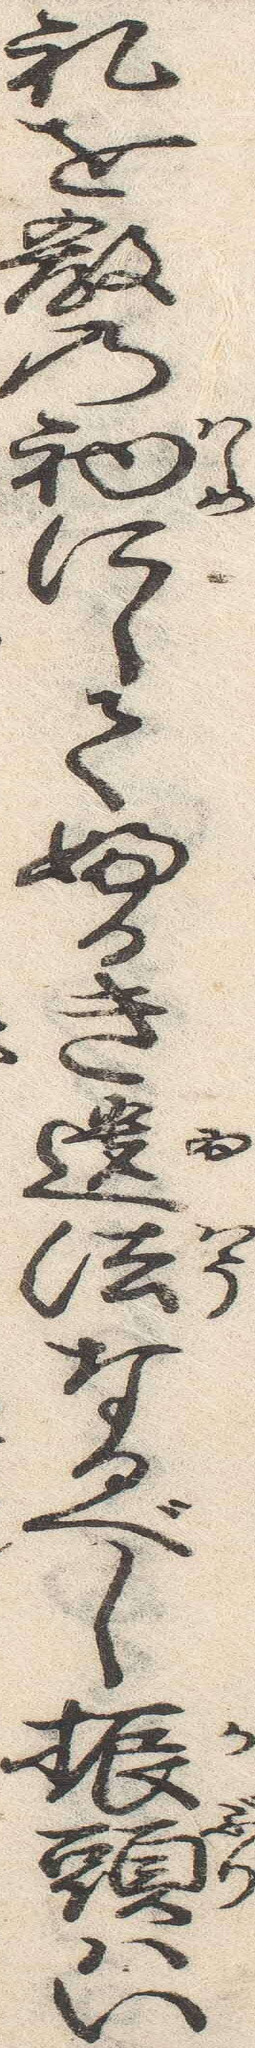礼を教の初にしてふるき遺法なるべし振頭はい
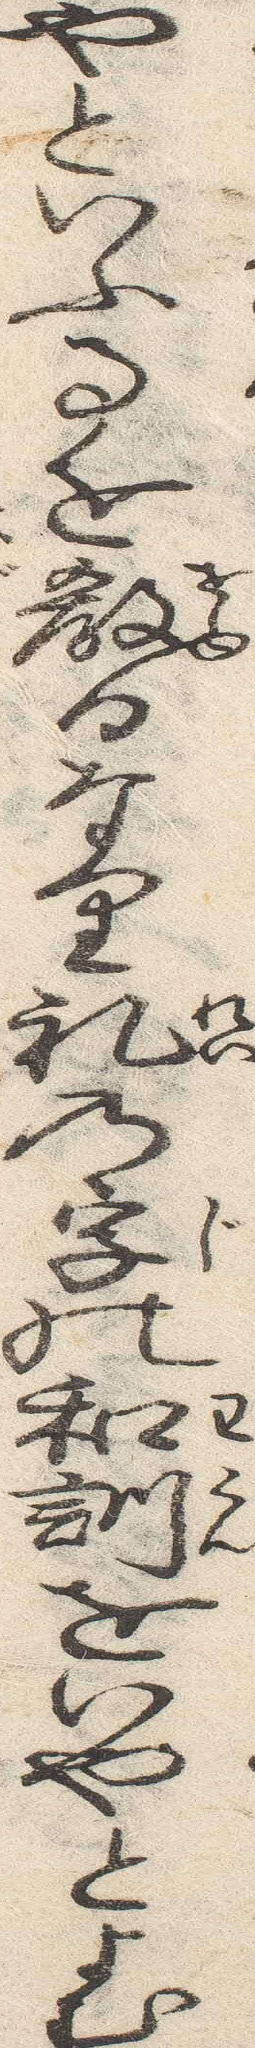やといふ事を教るなり礼の字の和訓をいやとよむ
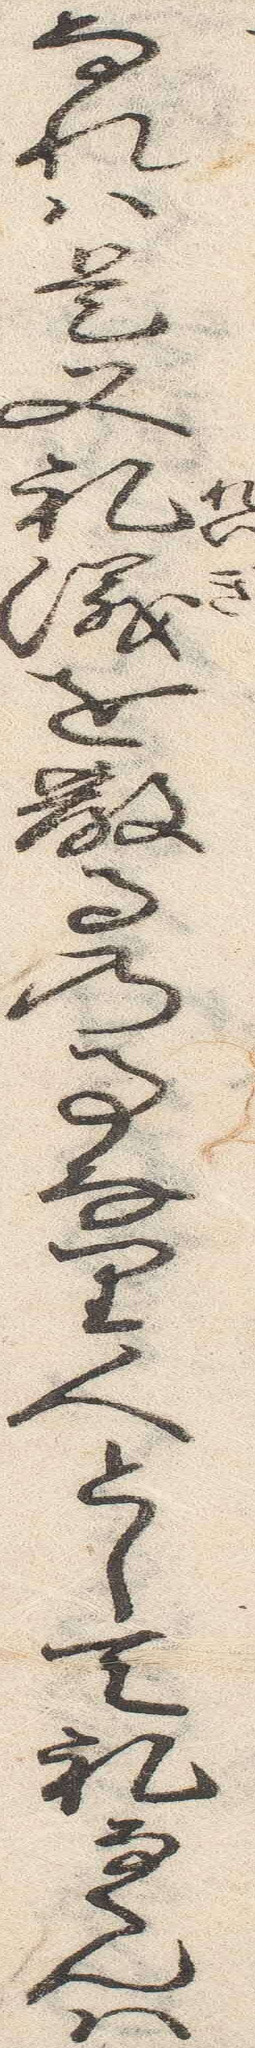なれは是又礼儀を教るの事なり人として礼なくんは
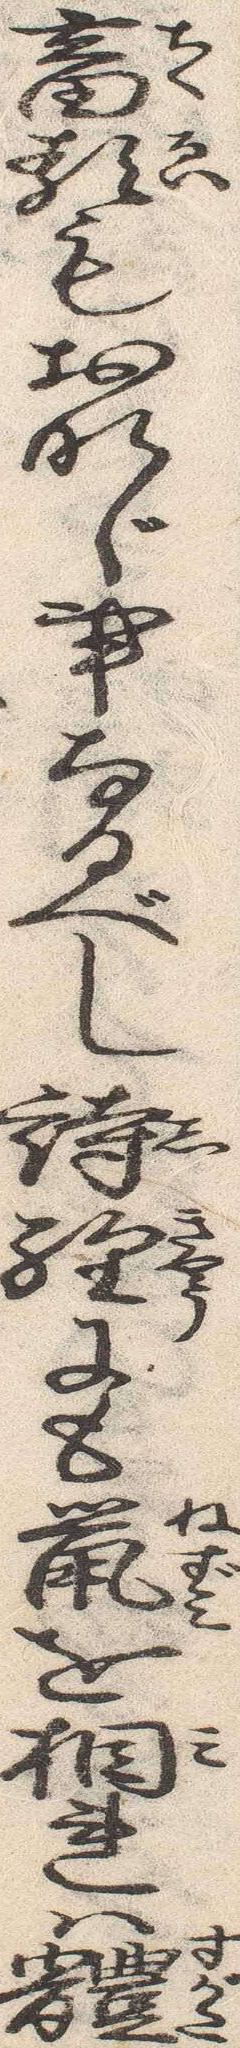畜類もおなじ事なるべし詩経にも鼠を相れは体
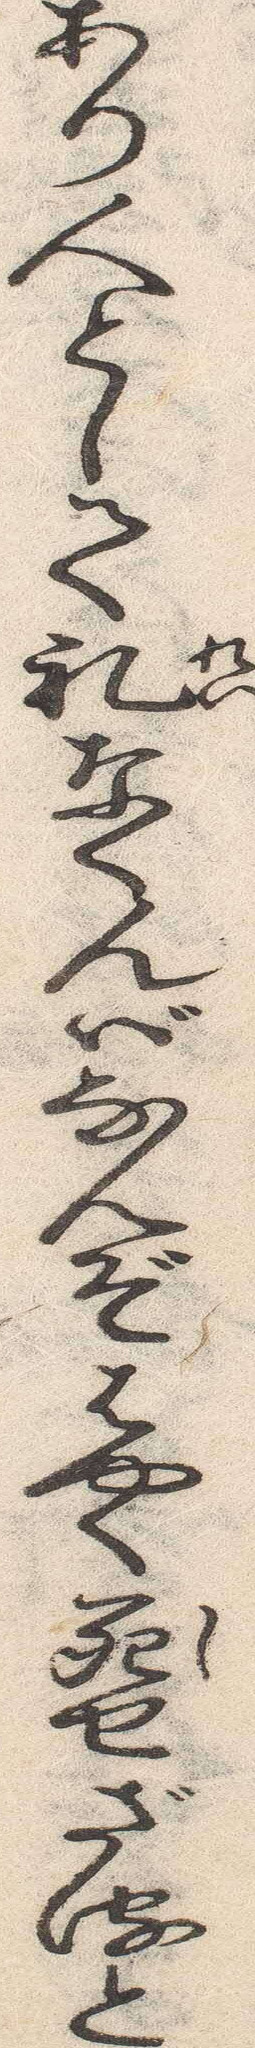あり人として礼なくんばなんぞはやく死せざると
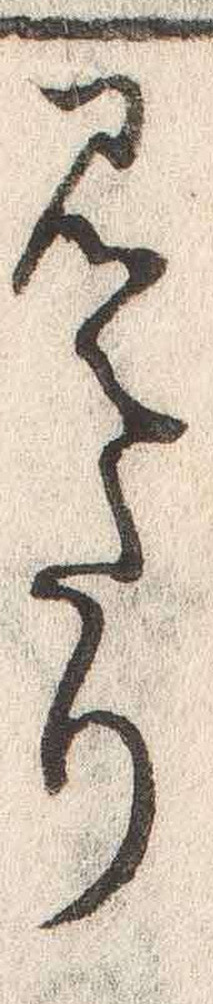見えたり
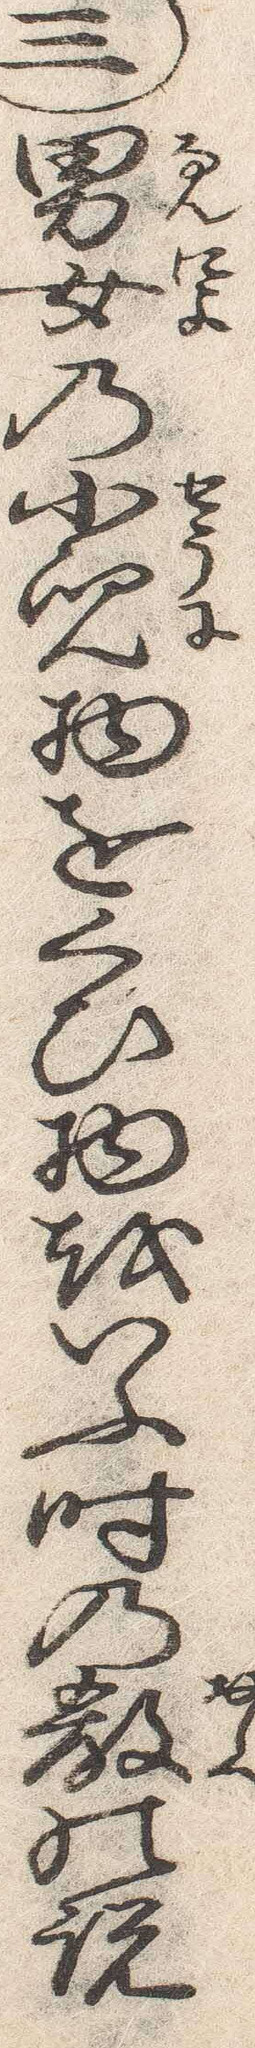㊂男女の小児物をくひ物をいふ時の教の説
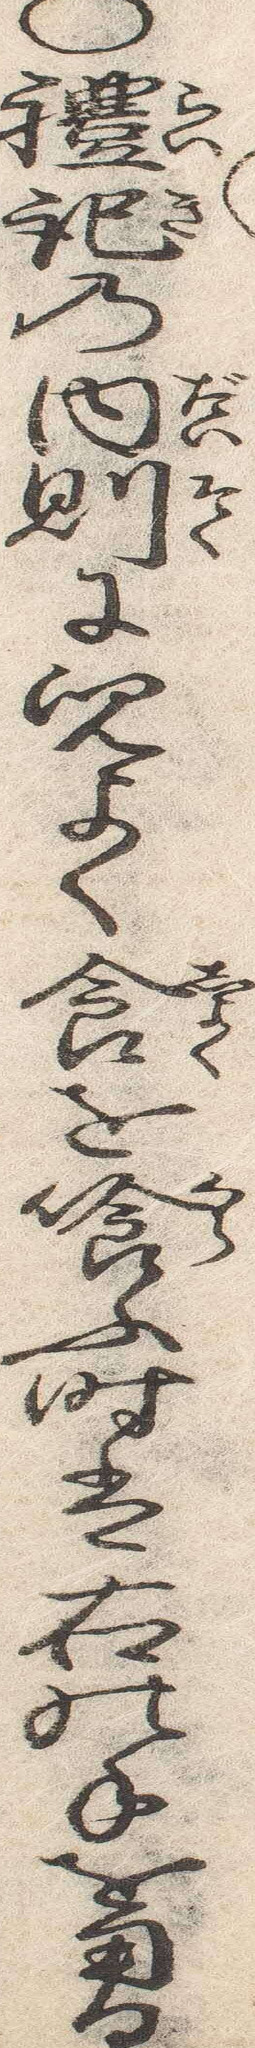○礼記の内則に児よく食を喰ふ時は右の手を用る
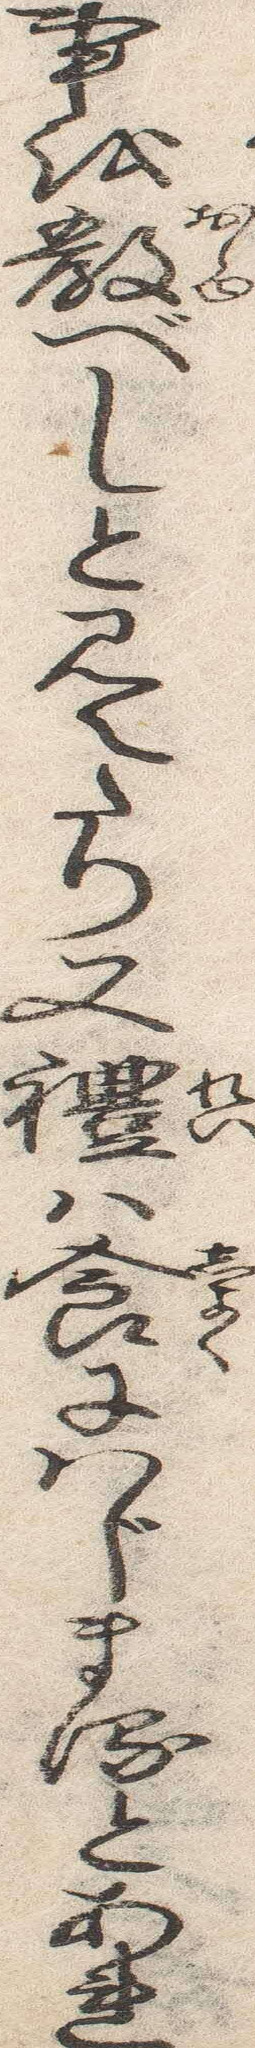事を教べしと見えたり又礼は食にはじまるとあれ
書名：小児必用養育草
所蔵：東京学芸大学附属図書館 国文学研究資料館
